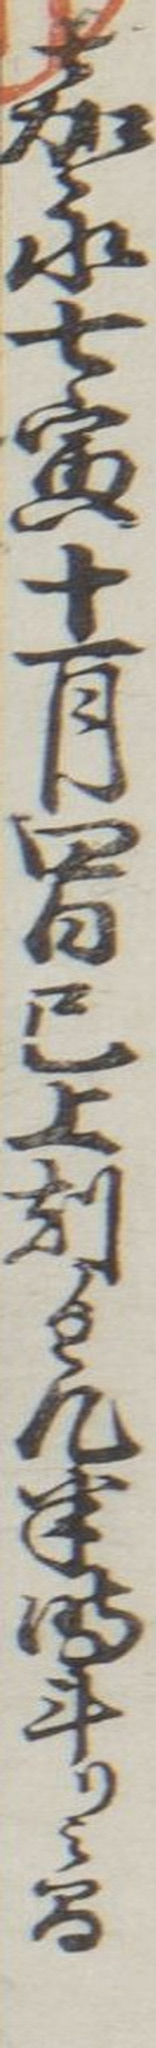嘉永七寅十一月四日巳上刻より凡半時斗り之間
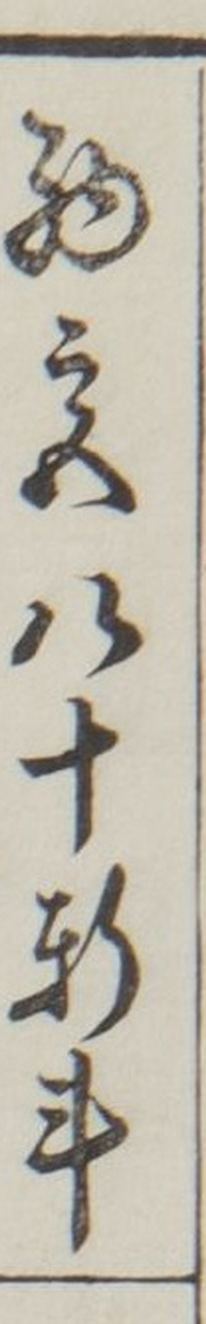西宮八十軒斗
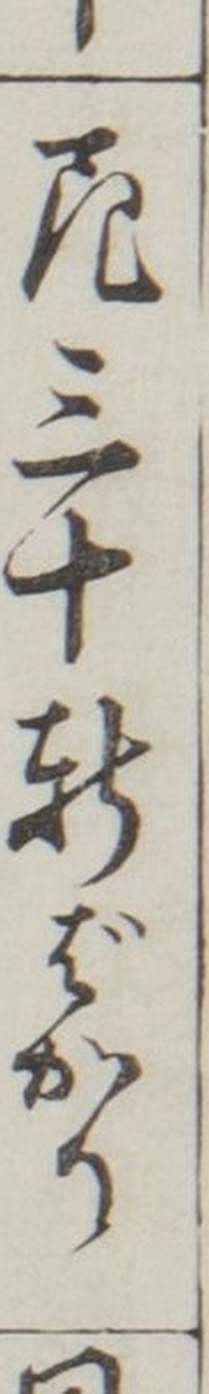尼三十軒ばかり
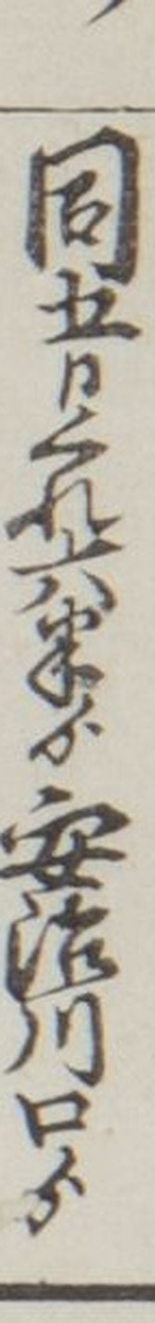同五日くれ六半より安治川口より
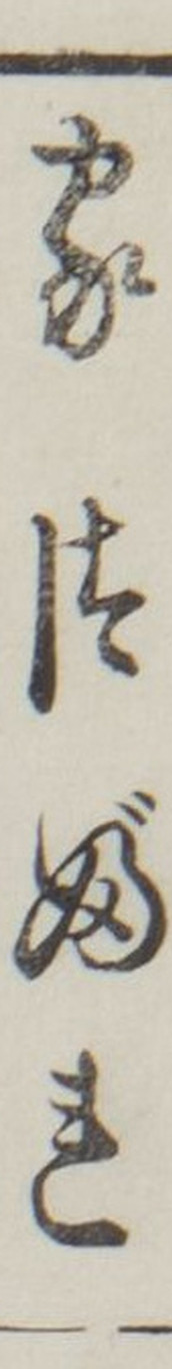家つぶれ
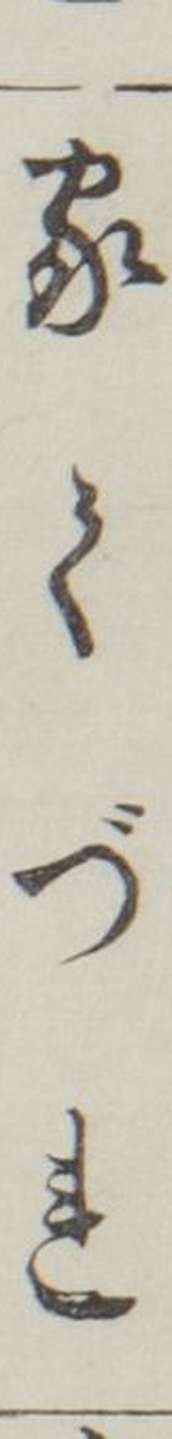家くづれ
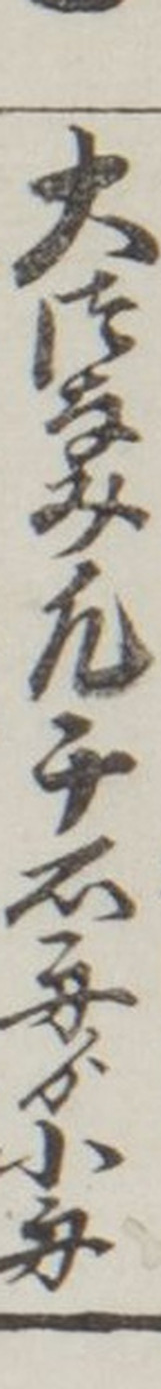大つなみ凡千石舟より小舟
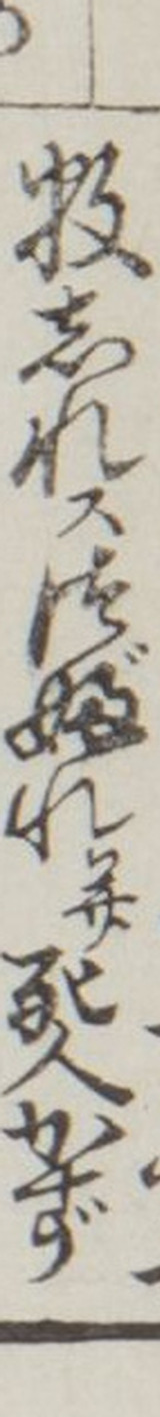数しれすつぶれ幷死人かず
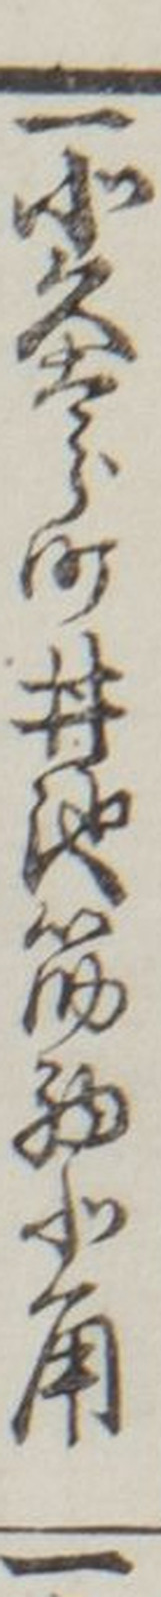一北久太郎町丼池筋西北角
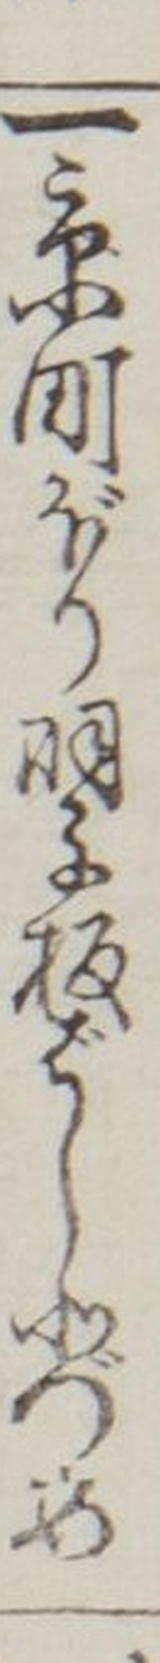一京町ぼり羽子板ばし北づめ
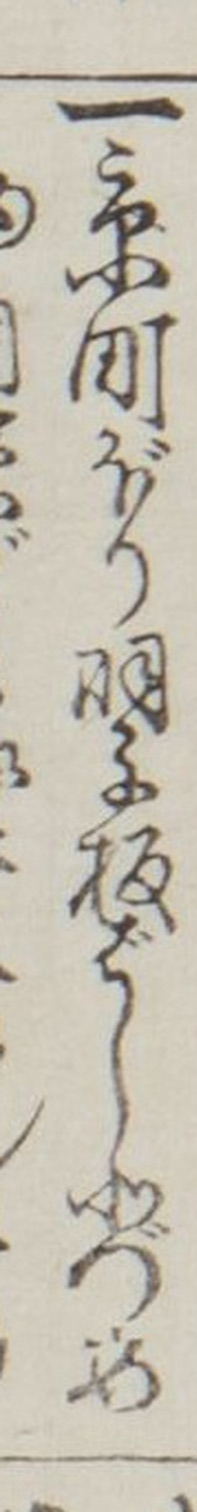一京町ぼり羽子板ばし北づめ
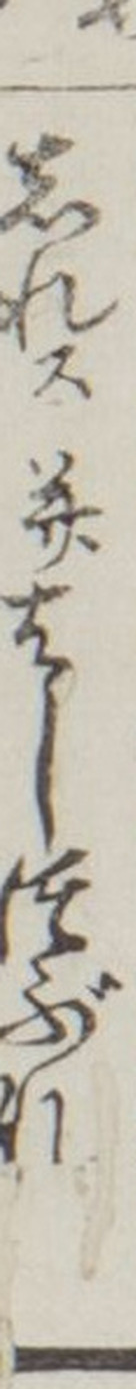しれす并はしつぶれ
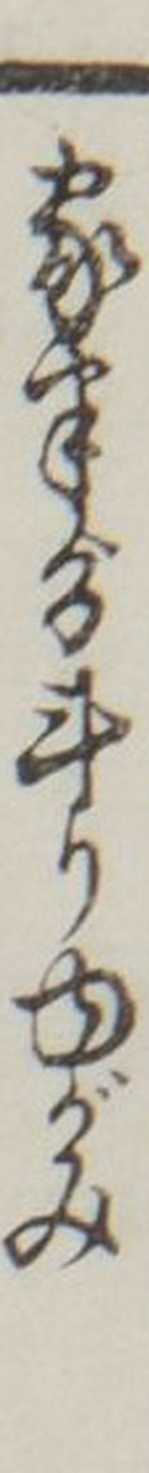家半分斗りゆがみ
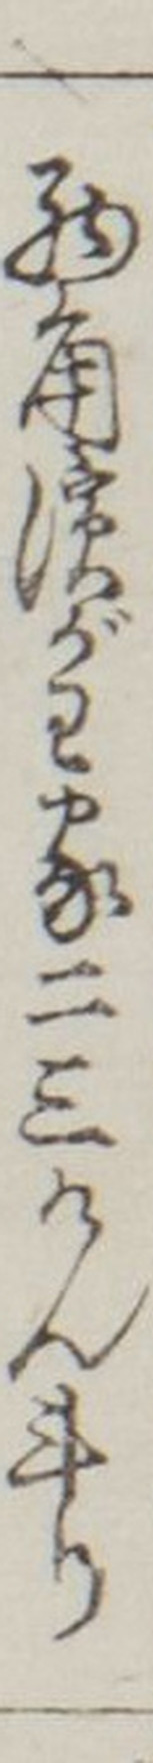西角浜がわ家二三けん斗り
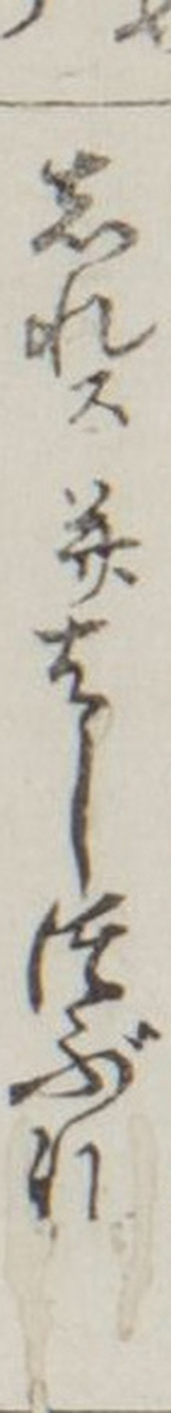しれす并はしつぶれ
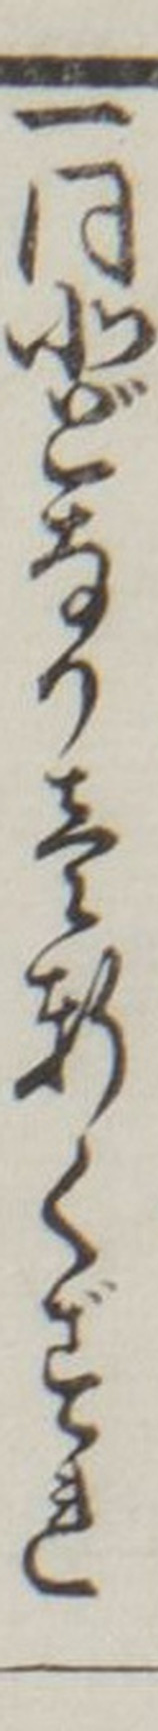一同北どなり一軒くずれ
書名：本志らべ大阪大地震大破略記
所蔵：あいおいニッセイ同和損保株式会社
